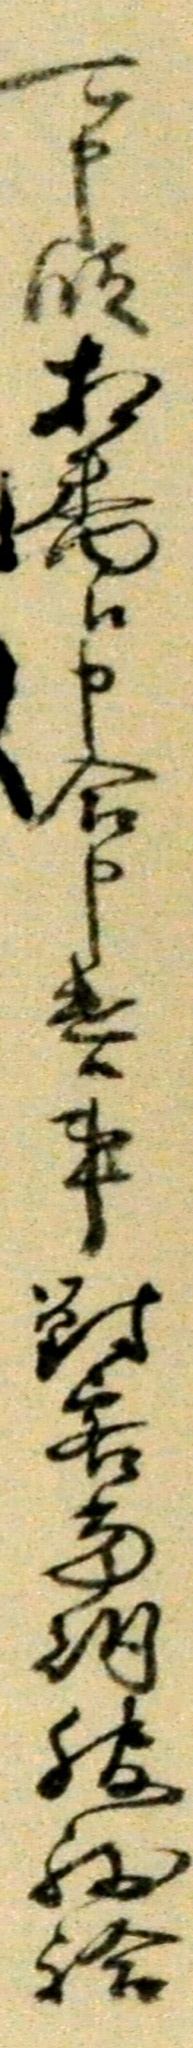可申段相番江申合申遣候事対客当朝服紗袷
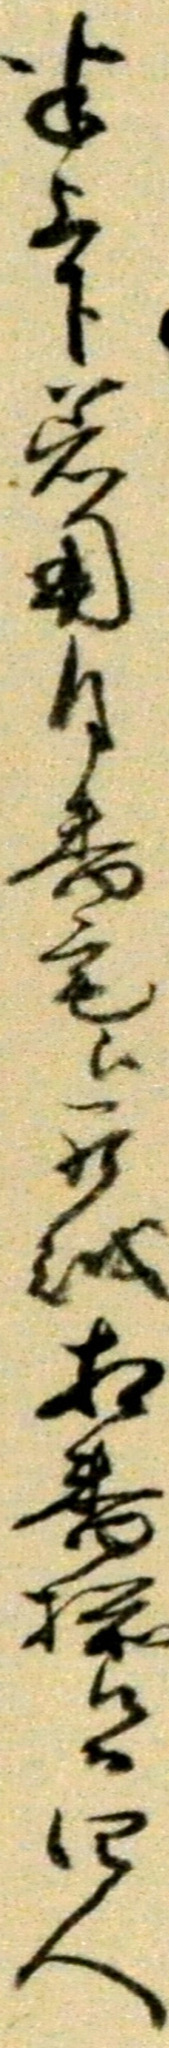半上下着用月番宅江罷越相番揃候而四人
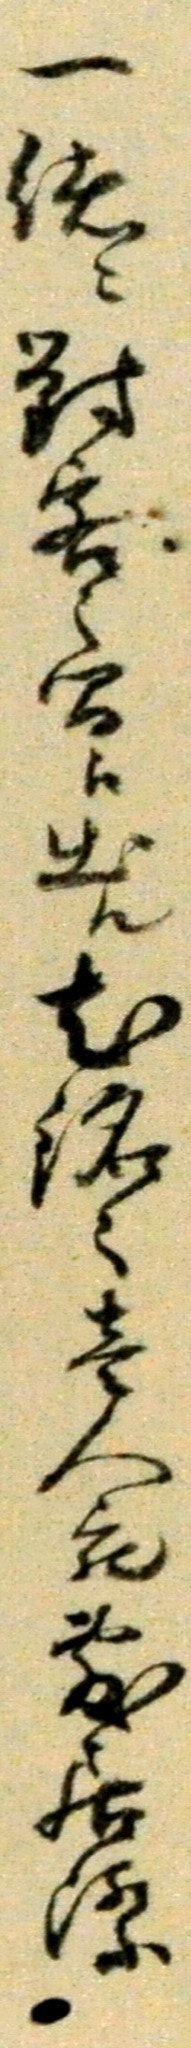一統ニ対客之間江出ㇽ尤銘々一人宛敷居際
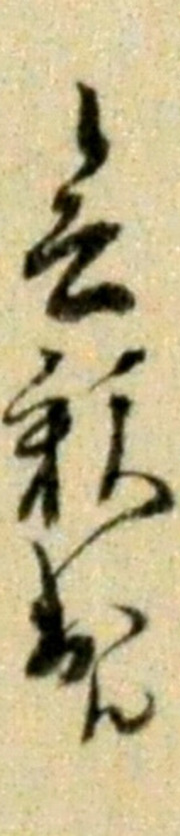会釈出ㇽ
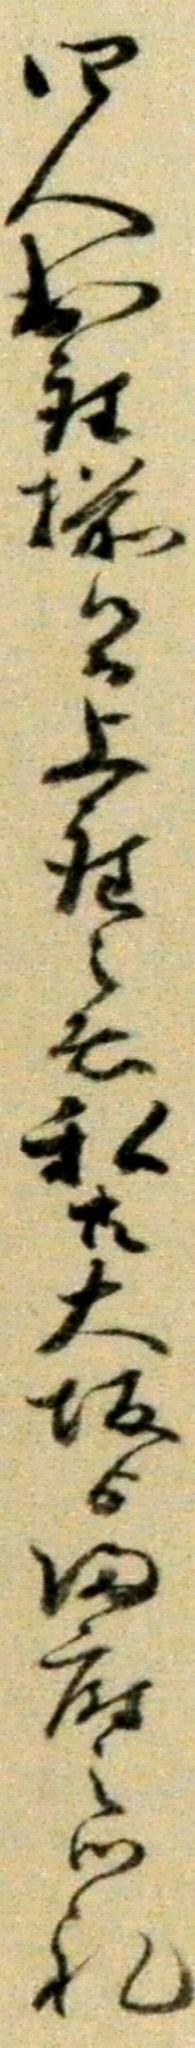四人出座揃候而上座之者私大坂ゟ帰府之御礼

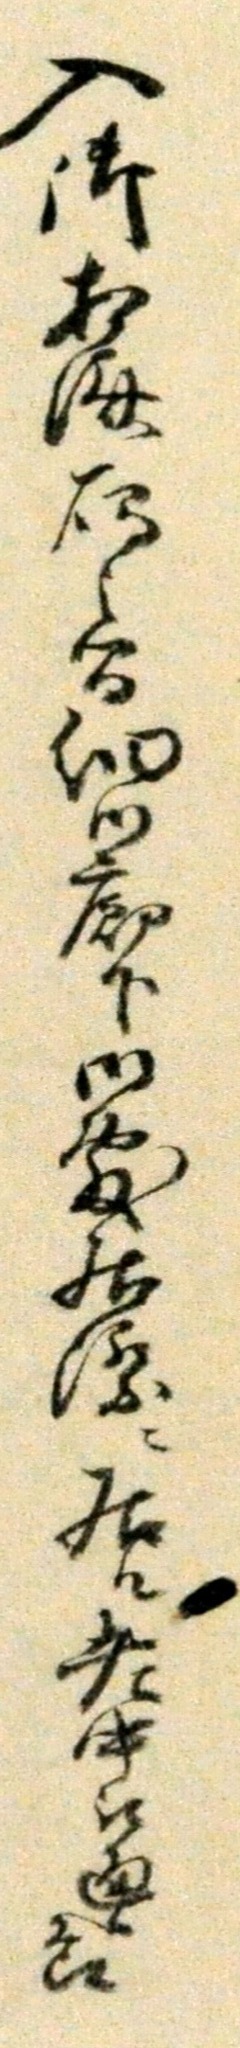入御相済雁之間仰御廊下御敷居際ニ居ㇽ老中被通候節
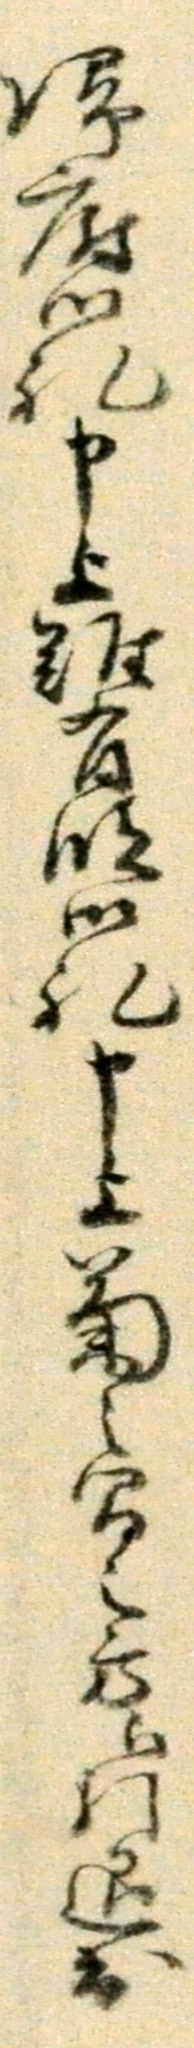帰府御礼申上難有段御礼申上菊之間之方江引退出
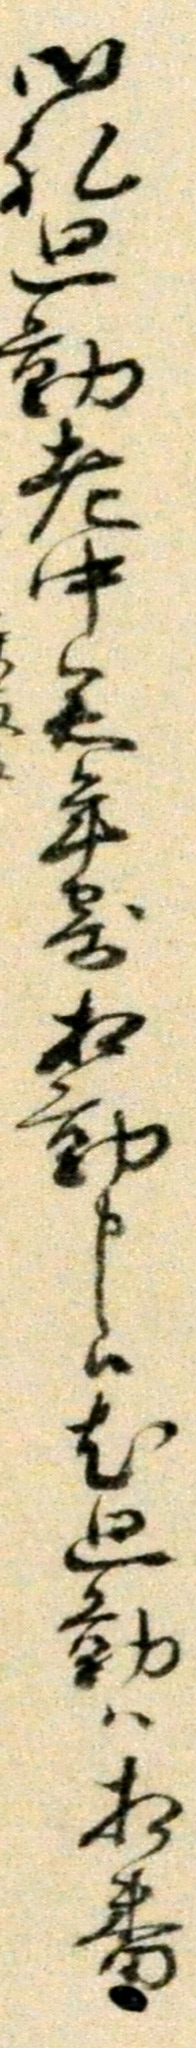御礼廻勤老中若年寄相勤申候尤も廻勤ㇵ相番
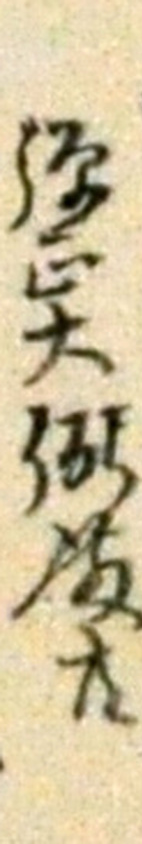弾正忠矦殿共
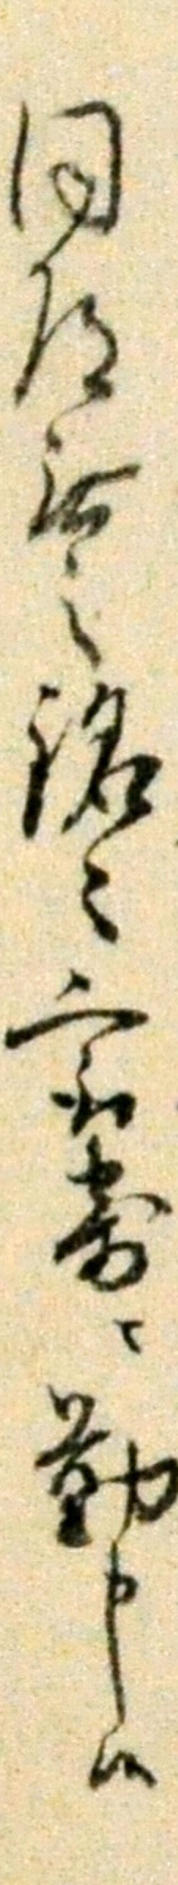同道無之銘々最寄ニ勤申候
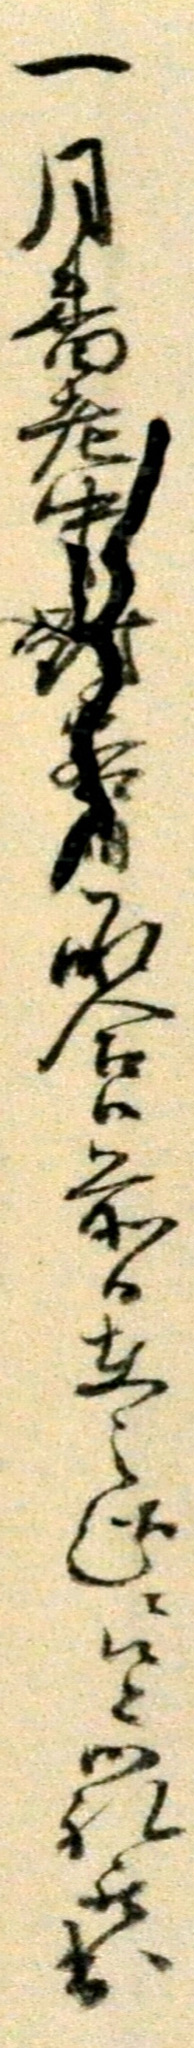一月番老中承合候前々在之趣ニ候と御礼被出
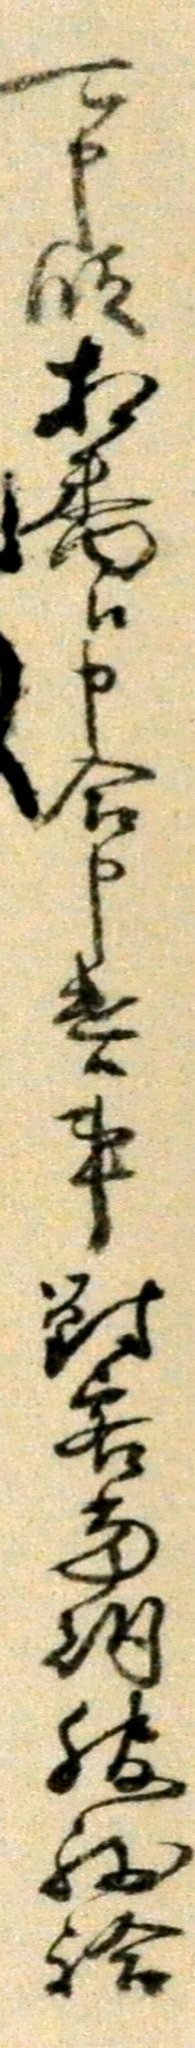可申段相番江申合申遣候事対客當朝服紗袷
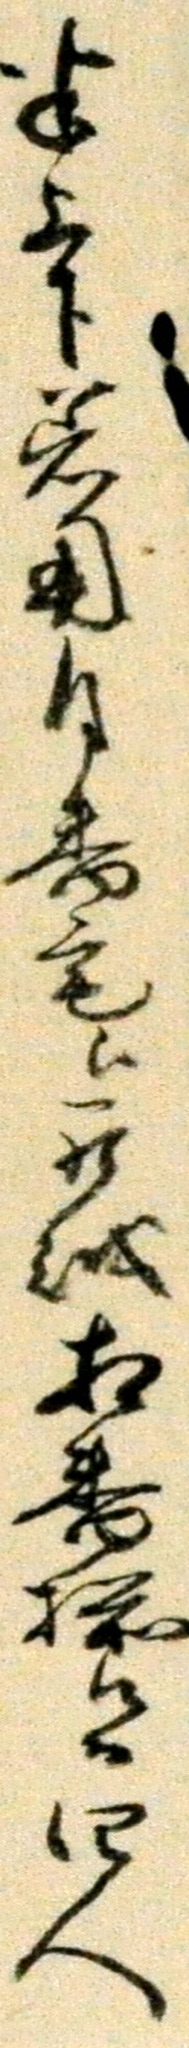半上下着用月番宅江罷越相番揃候而四人
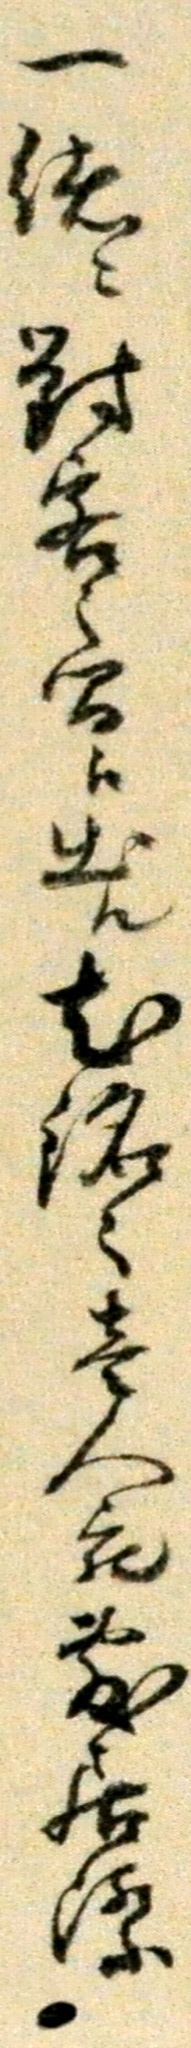一緒ニ対客之間江出ㇽ尤銘々壱人宛敷居際
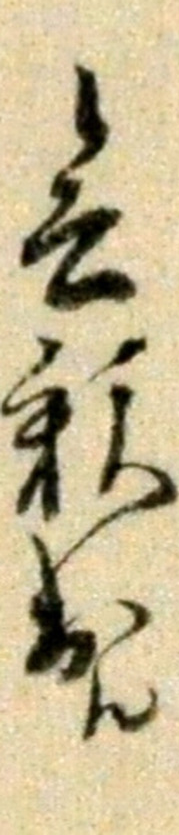会釈出ㇽ
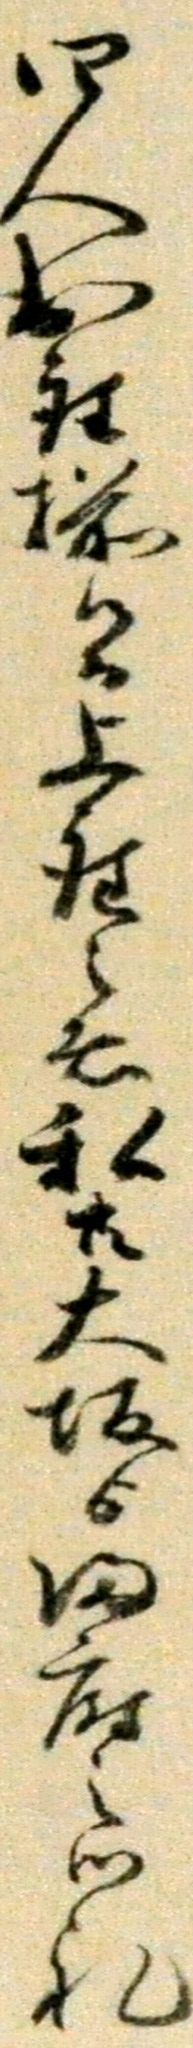四人出座揃候而上座之者私共大坂ゟ帰府之御礼
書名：大阪加番関係諸書留〔一括〕
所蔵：伊那市立高遠町図書館・合同会社AMANE
